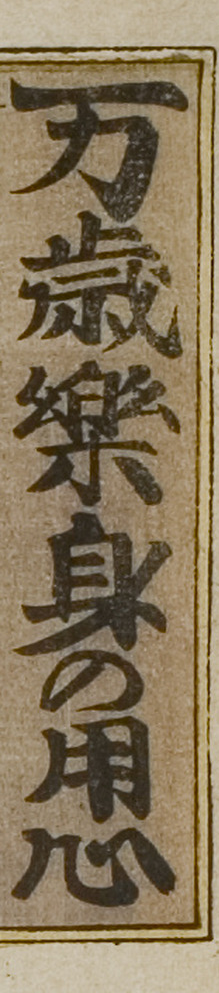万歳楽身の用心
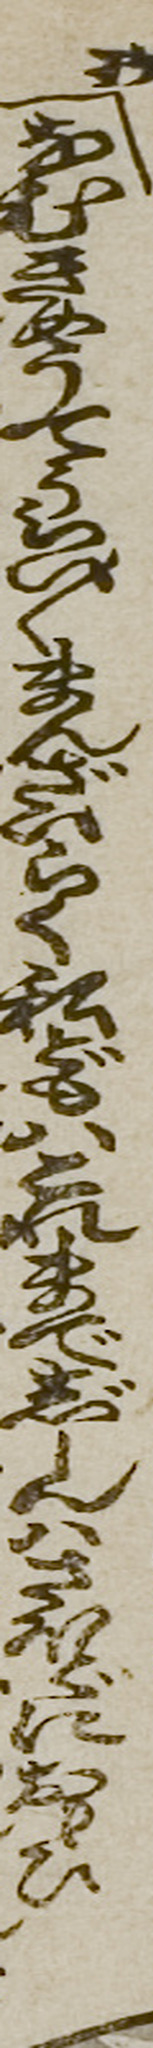材〽なむきめうてうらい〳〵まんざいらく私どもはこれまでじしんはさほどにおもひ
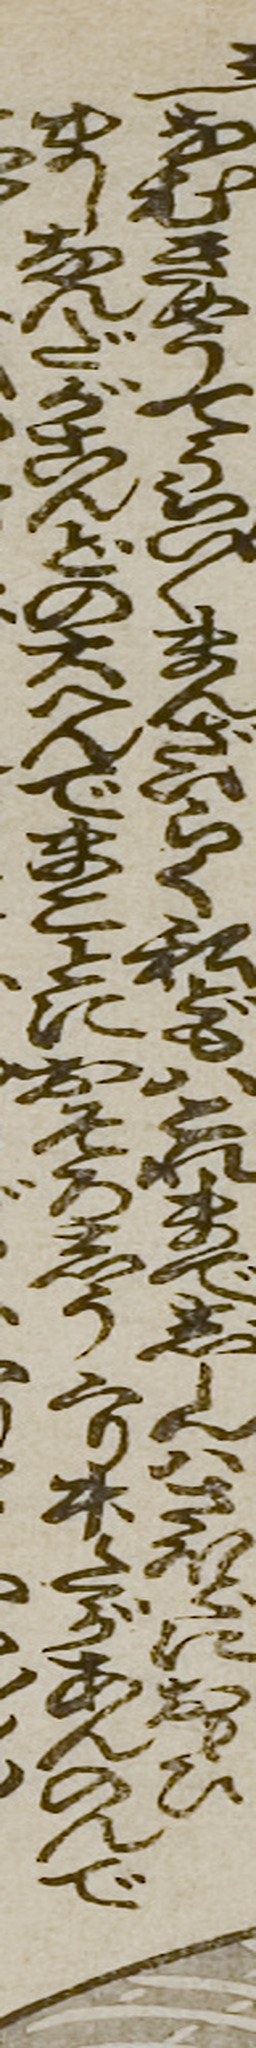ましなんだがこんどの大へんでまことにおそろしう御座り升たがあんのんで
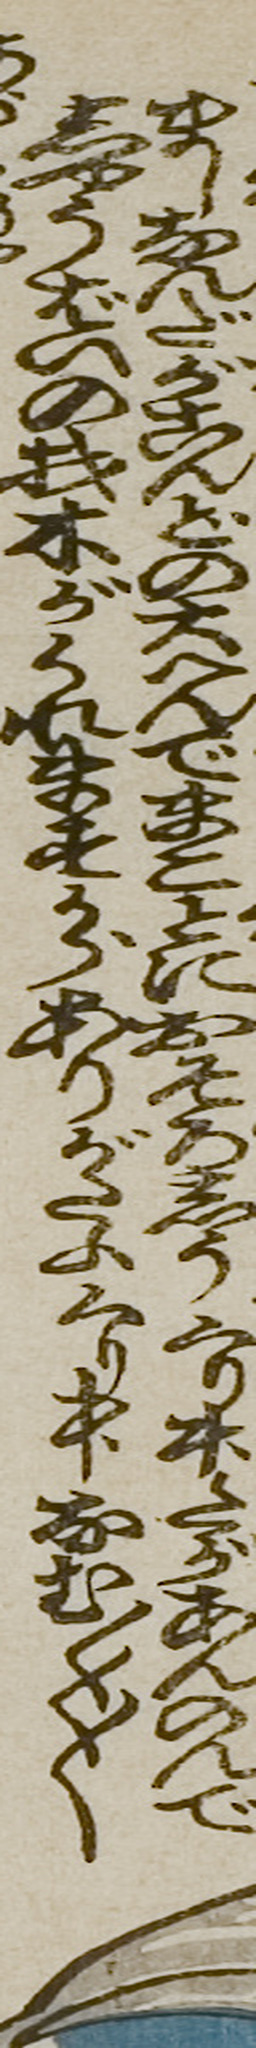しやうばいの材木がうれますからありがたふ御座り升なむ〳〵〳〵〳〵
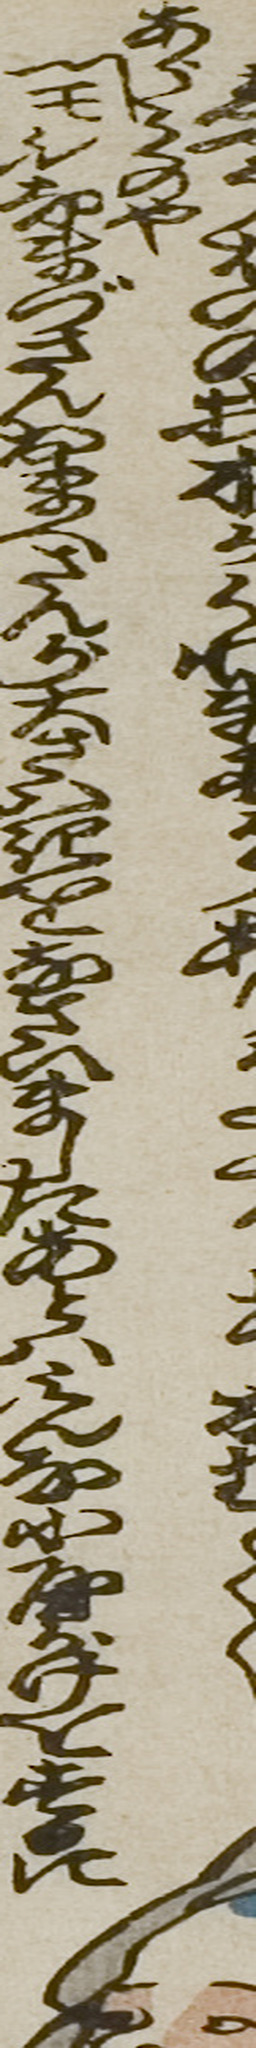〽もしなまづさんおまへさんら大さはきをなさいましたあとはみんな小屋かけをするに
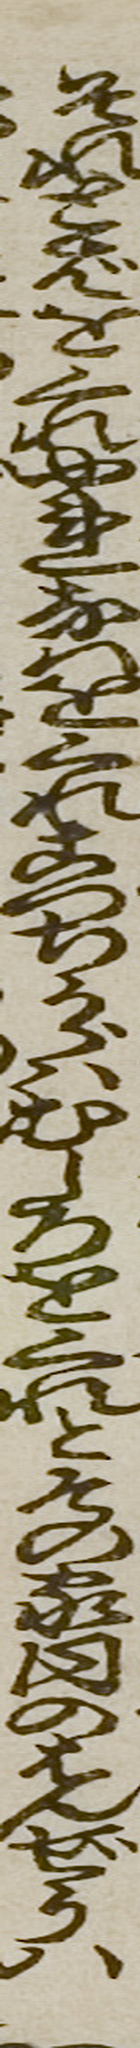それとばをくれやれなはをくれこつちからはむしろをくれとその家内のはんぜうは
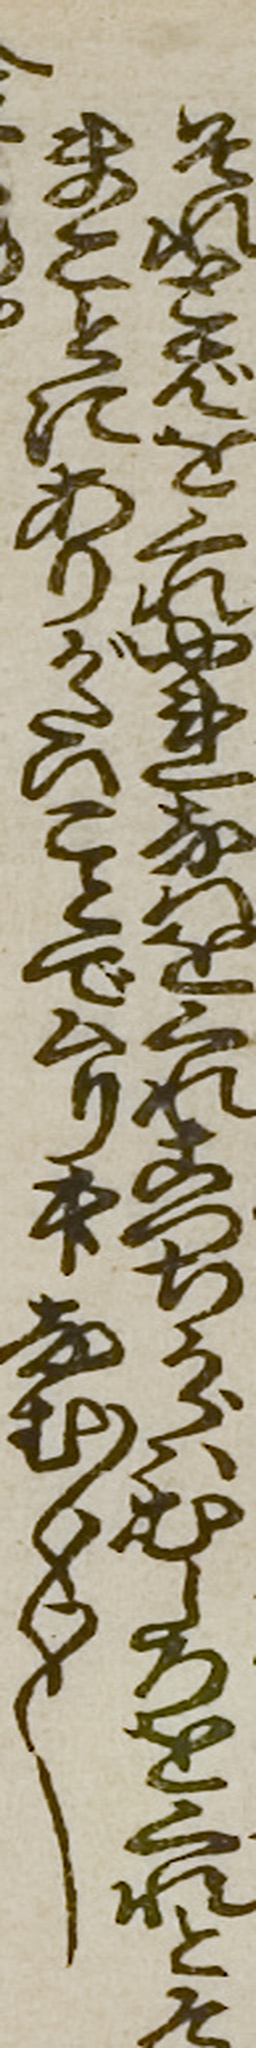まことにありがたいことで御座り升なむ〳〵〳〵〳〵
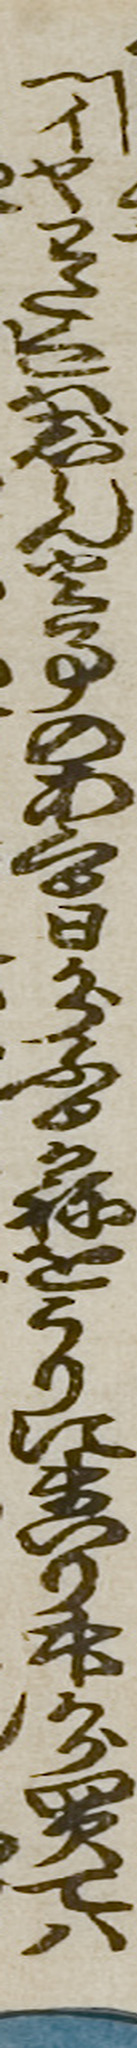〽いやわたくしはじしん火事あくる日からふるかねをうりにまいり升から買ては
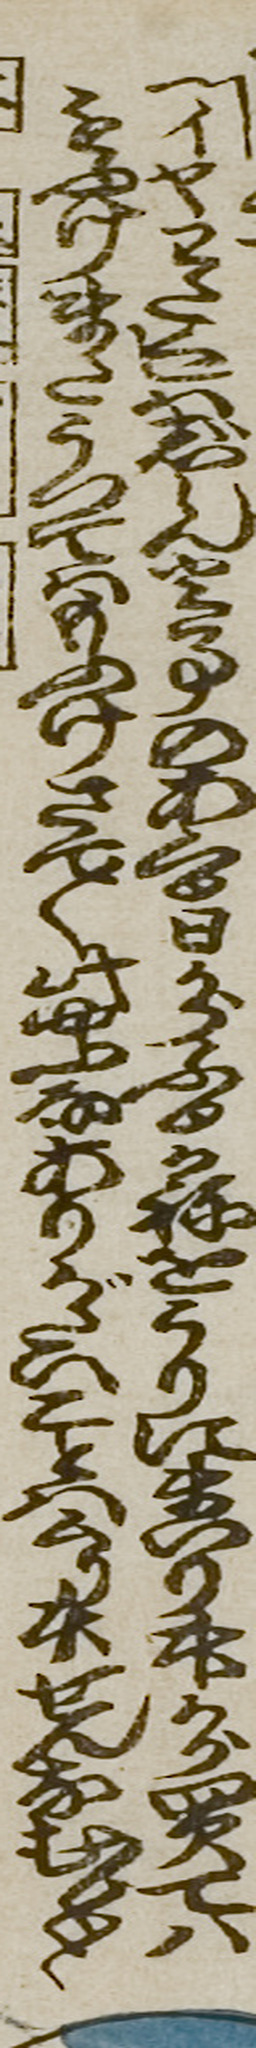もふけまたうつてはもふけさて〳〵此やふなありがたいことは御座り升せんなむ〳〵〳〵〳〵
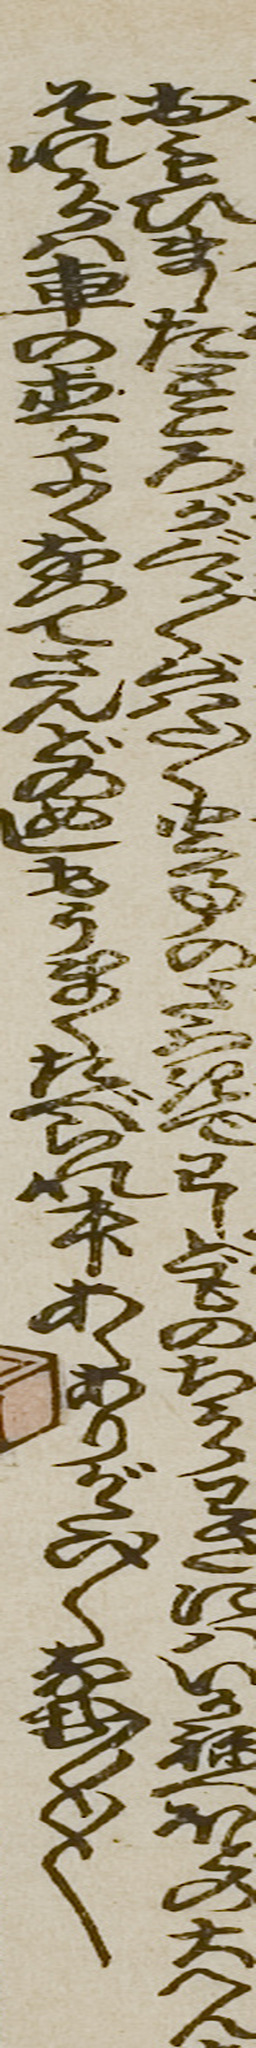それからは車の直かよくなつてさんどのめしもうまくたべられ升あゝありがたい〳〵なむ〳〵〳〵〳〵
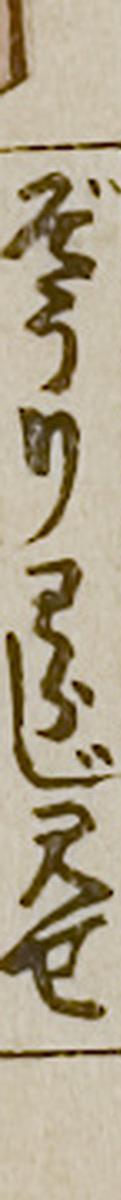ぞうりわらじみせ
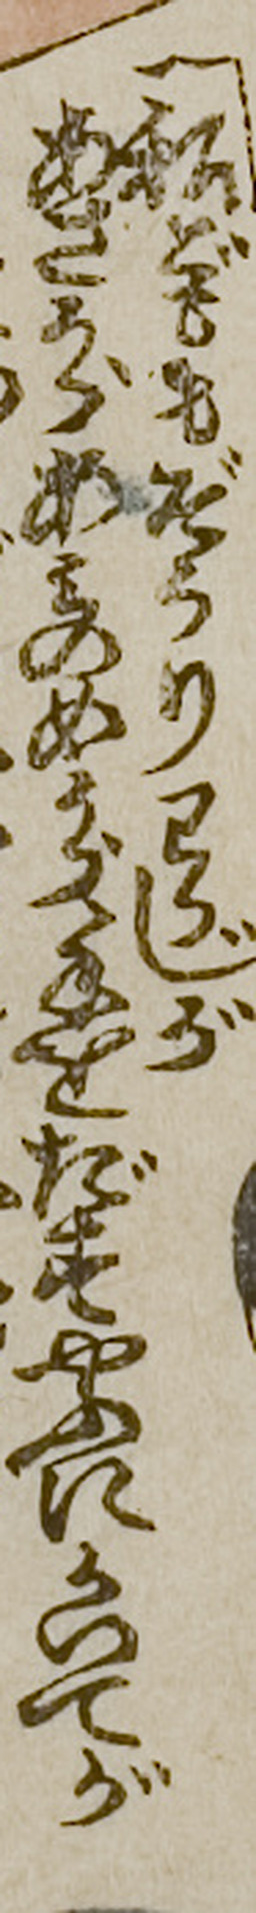あさからあみのめから手をだすやふにかいてが
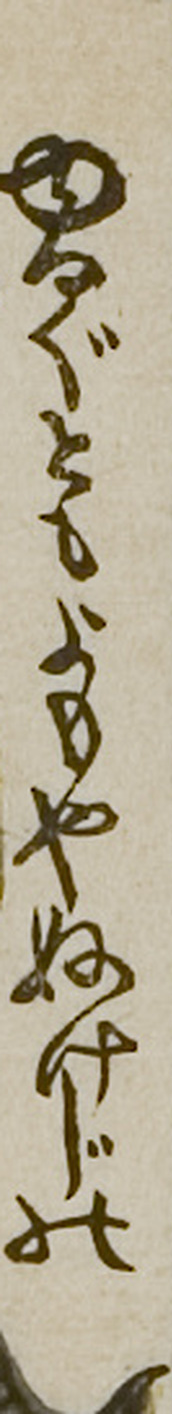ゆるぐともよもやぬけじの
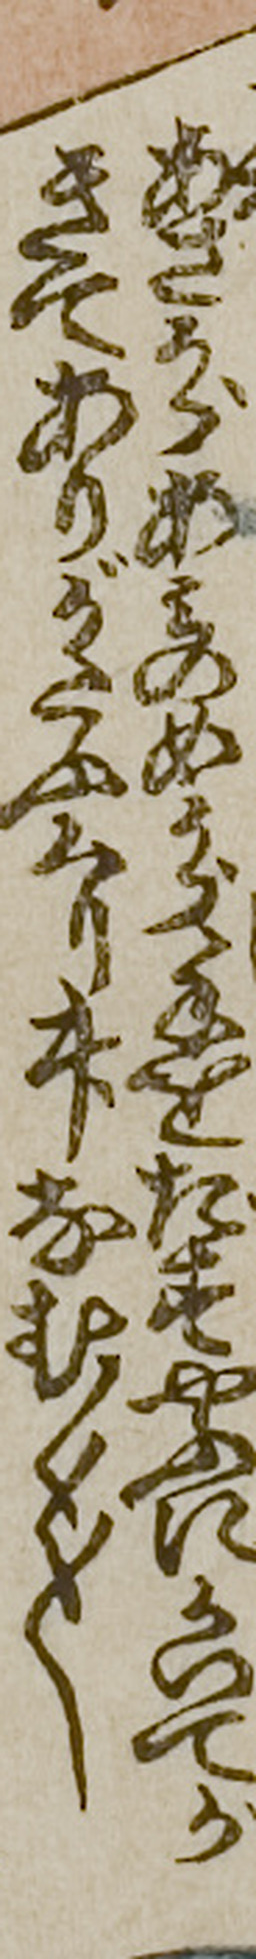きてありがたふ御座り升なむ〳〵〳〵〳〵
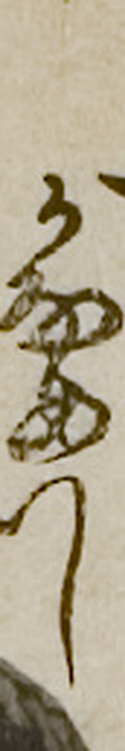かなめいし
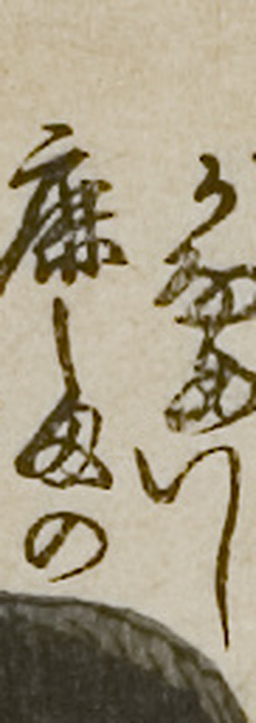鹿しまの
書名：万歳楽身の用心
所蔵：東京大学総合図書館 General Library in the University of Tokyo, JAPAN
